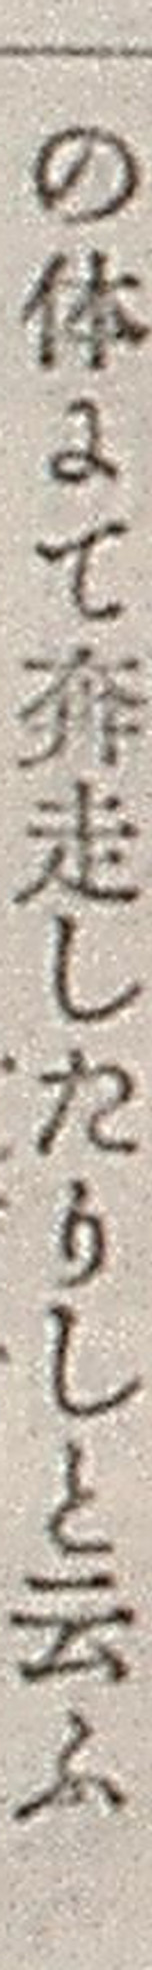の体にて奔走したりしと云ふ
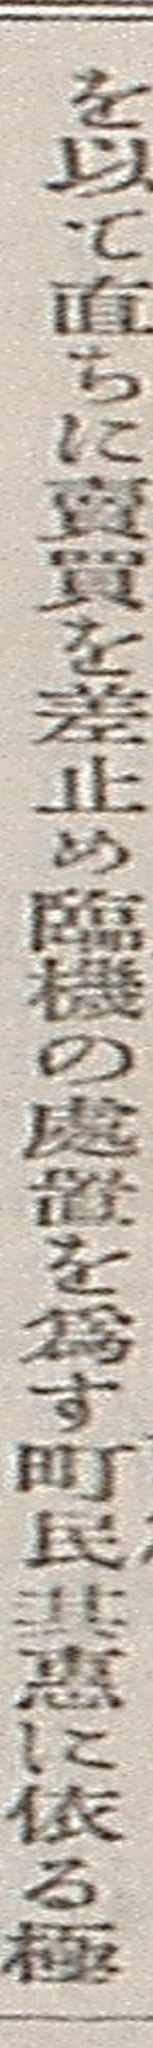を以て直ちに売買を差止め臨機の処置を為す町民其恵に依る極
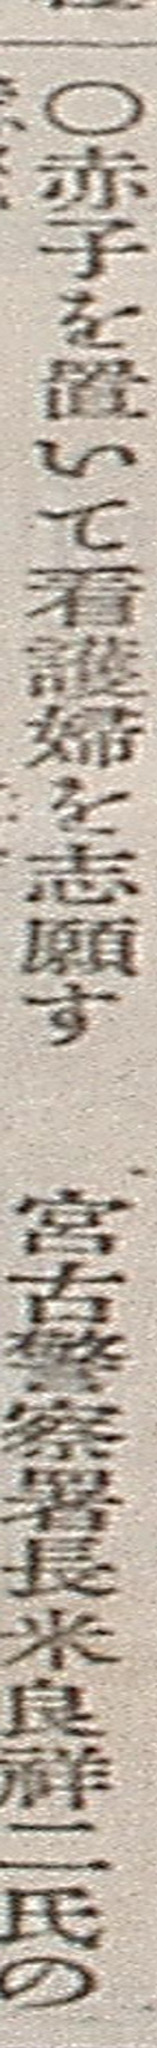○赤子を置いて看護婦を志願す宮古警察署長米良祥二氏の
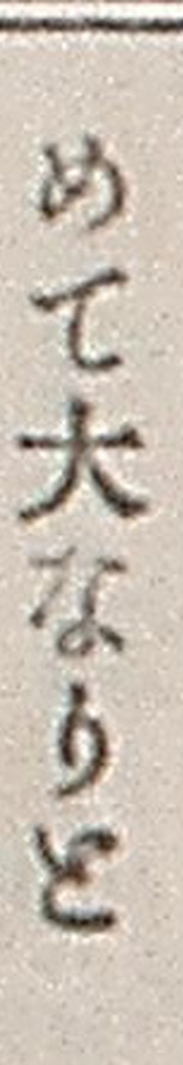めて大なりと
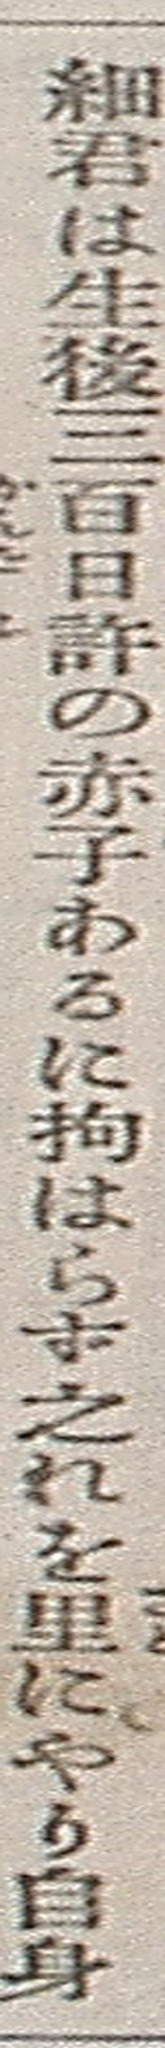細君は生後三百日許の赤子あるに拘はらず之れを里にやり自身
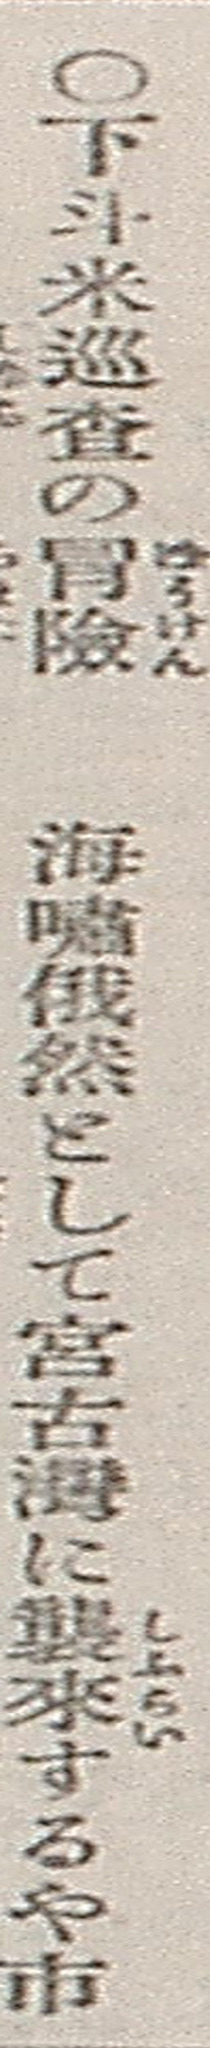○下斗米巡査の冒険海嘯俄然として宮古湾に襲来するや市
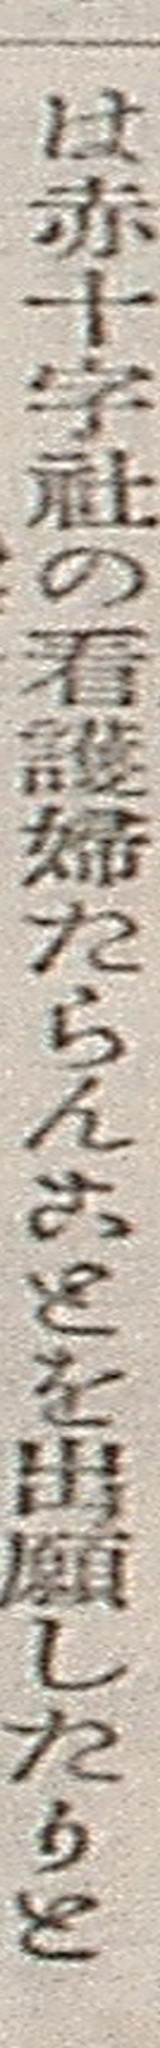は赤十字社の看護婦たらんことを出願したりと
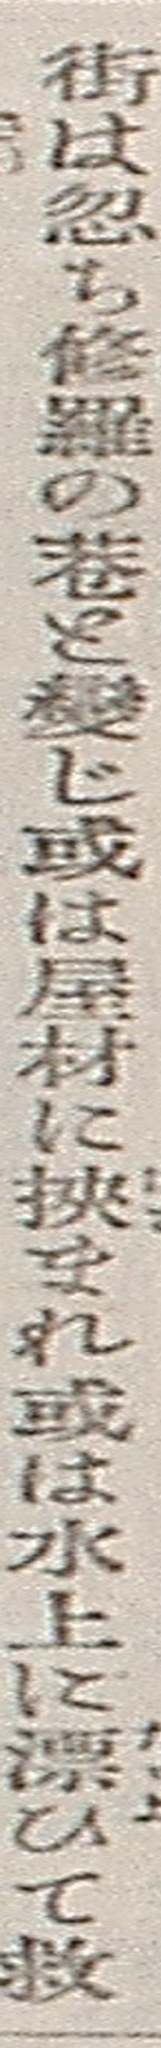街は忽ち修羅の巷と変じ或は屋材に挟まれ或は水上に漂ひて救
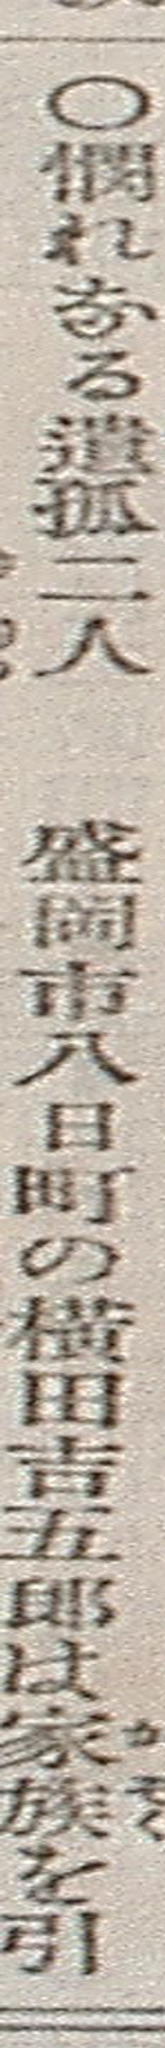○憫れなる遺孤二人盛岡市八日町の横田吉五郎は家族を引
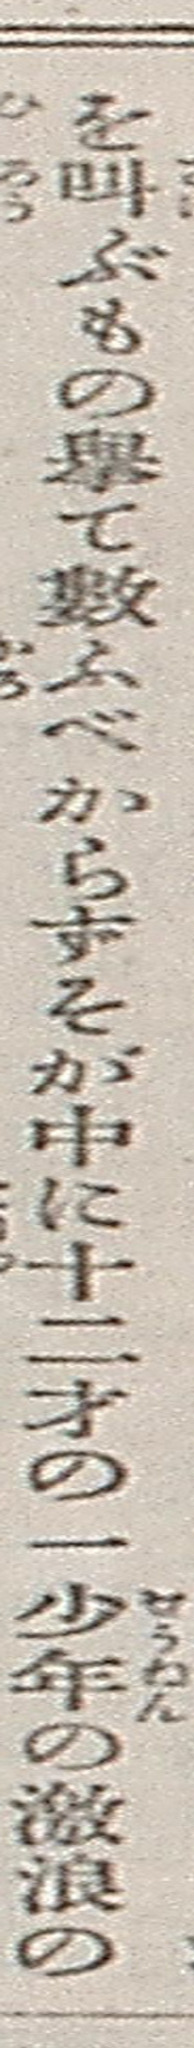を叫ぶもの挙て数ふべからずそが中に十二才の一少年の激浪の
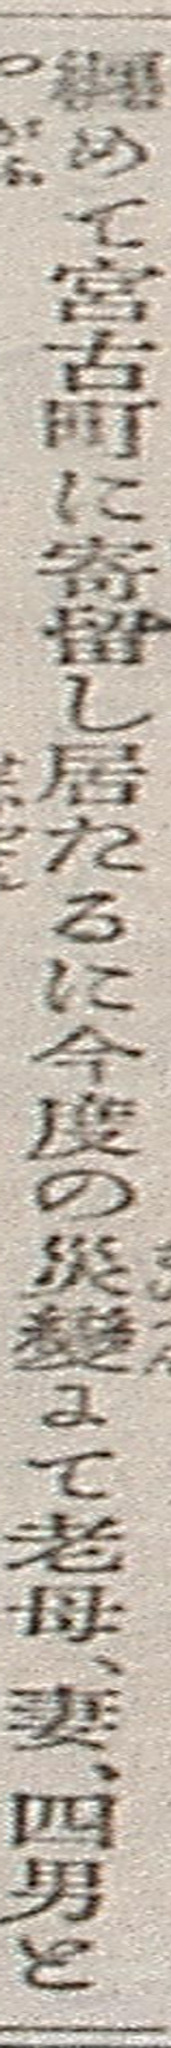纏めて宮古町に寄留し居たるに今度の災変にて老母、妻、四男と
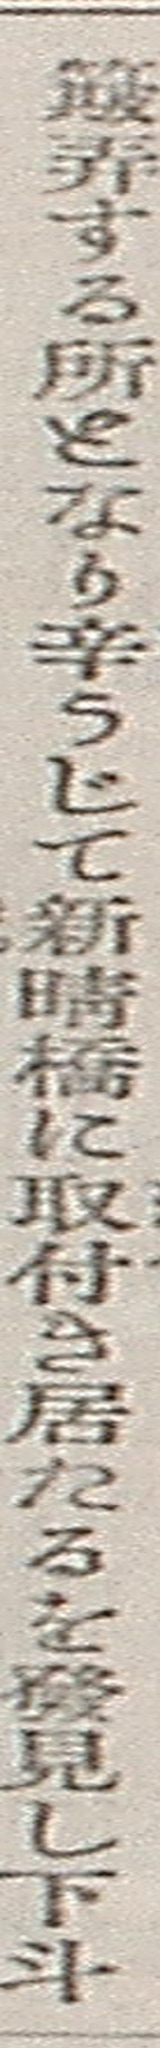簸弄する所となり辛うじて新晴橋に取付き居たるを発見し下斗
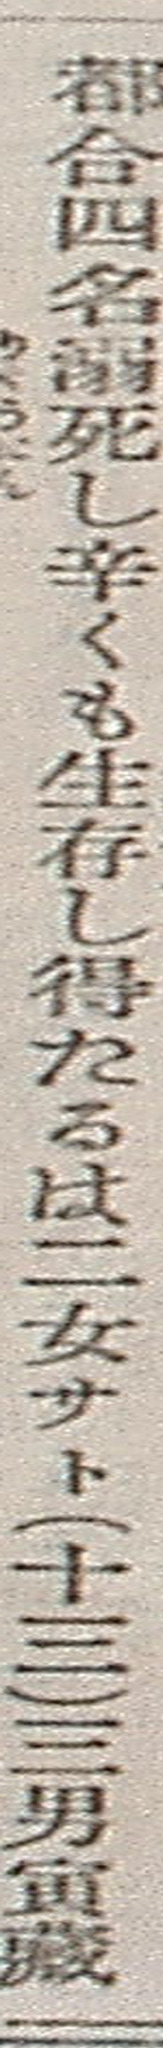都合四名溺死し辛くも生存し得たるは二女サト三男寅蔵
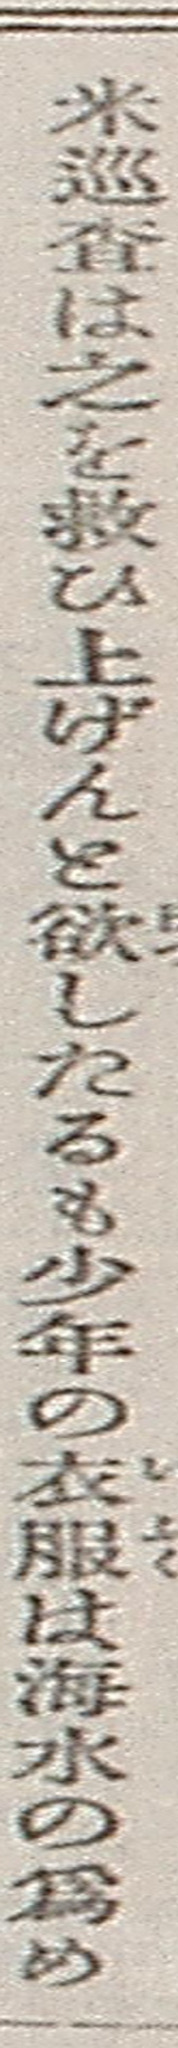米巡査は之を救ひ上げんと欲したるも少年の衣服は海水の為め
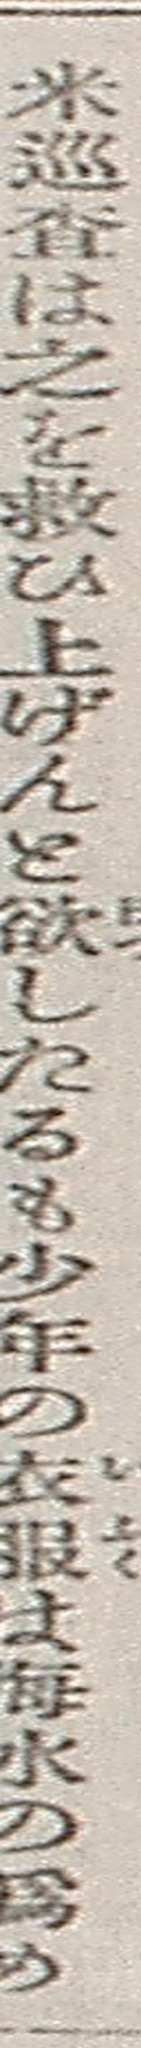米巡査は之を救ひ上げんと欲したるも少年の衣服は海水の為め
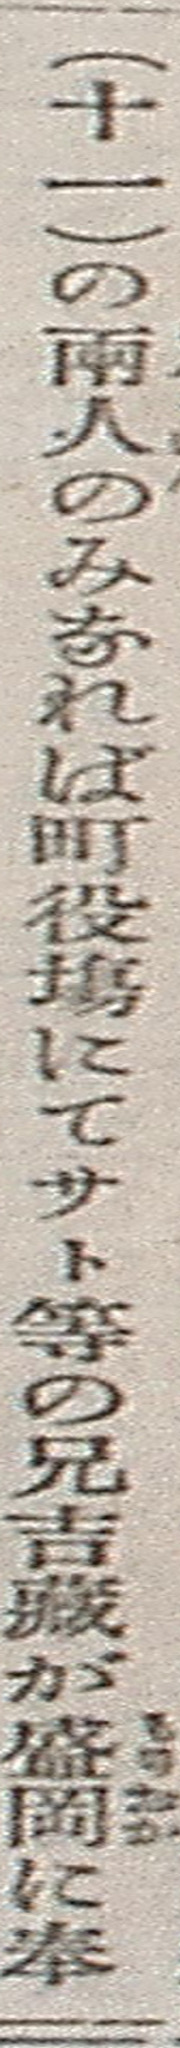の両人のみなれば町役場にてサト等の兄吉蔵が盛岡に奉
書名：風俗畫報臨時増刊第百十九號　大海嘯被害録（中）
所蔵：東京大学地震研究所図書室 Earthquake Research Institute Library, The University of Tokyo, JAPAN
